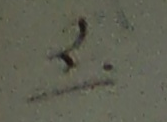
2.
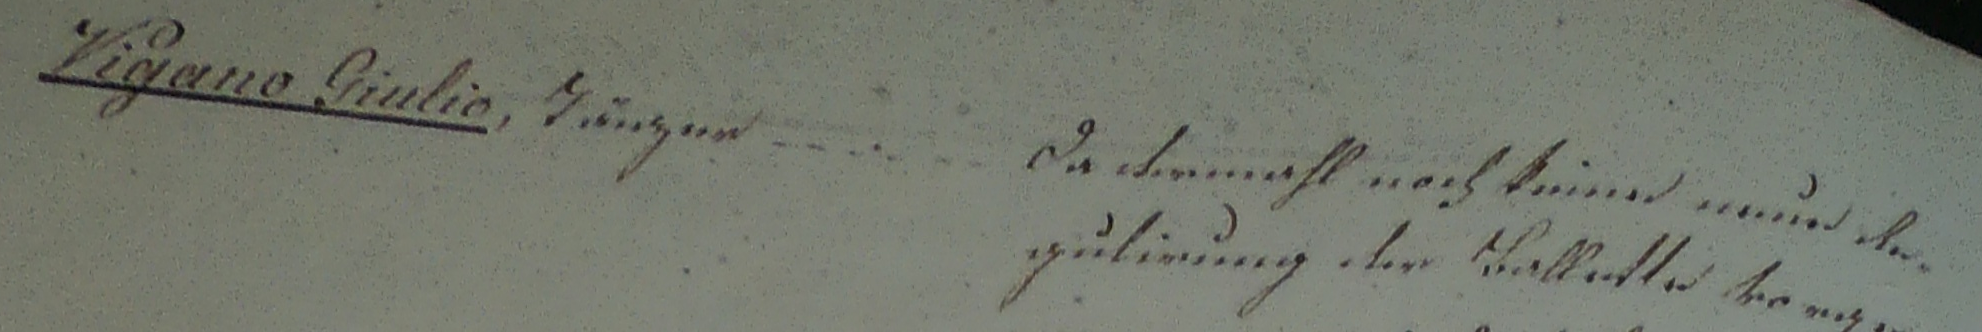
Vigano Giulio, Tänzer …… Da dermahl noch keine neue Re¬
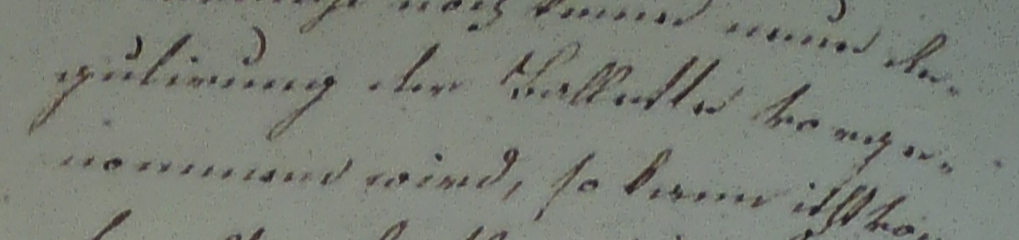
gulirung der Balette vorge¬
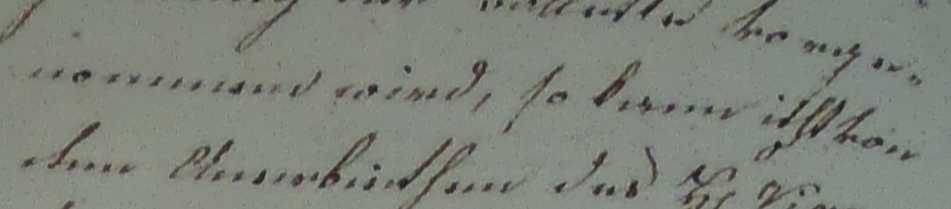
nommen wird, so kann itzt von
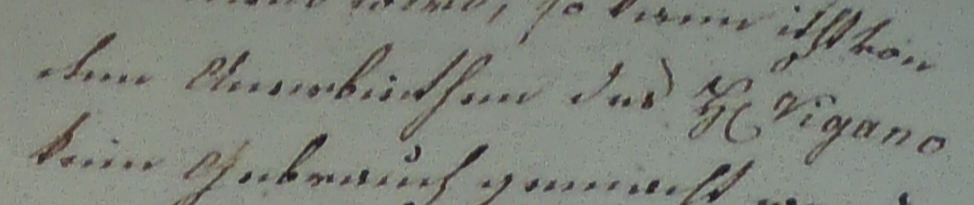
den Anerbiethen des HE Vigano
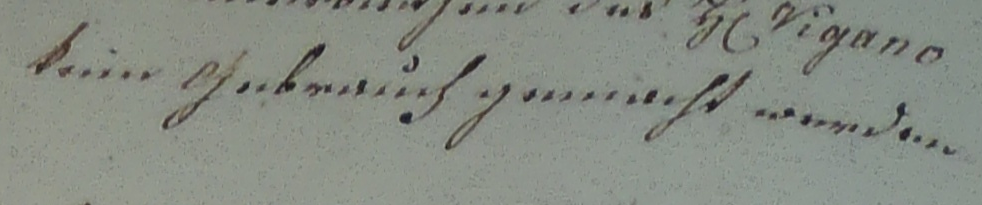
kein Gebrauch gemacht werden.
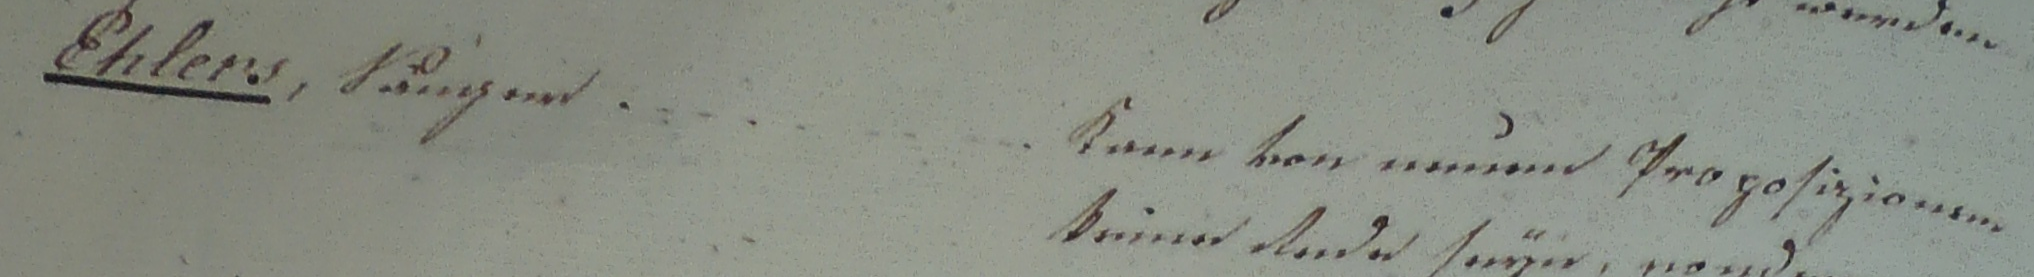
Ehlers, Sänger ….. …. Kann von neuen Progofizionen
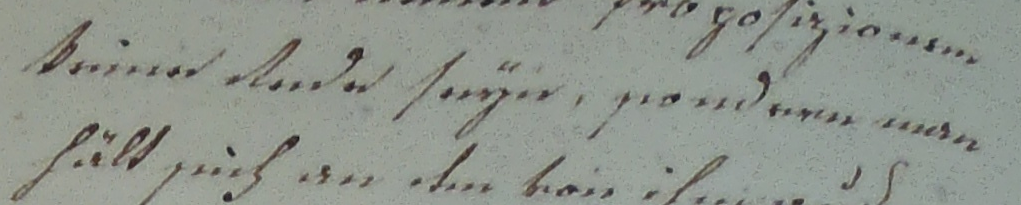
keine Rede seyn, sondern man
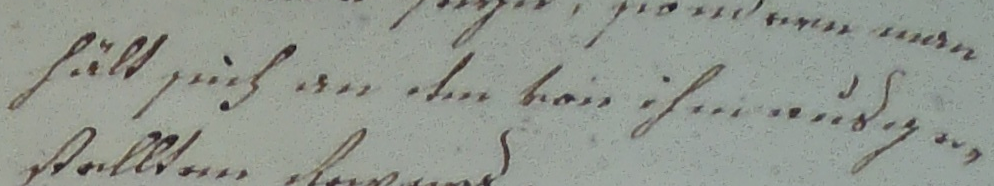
hält sich an den von ihm ausge¬
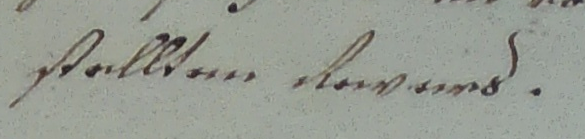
stellten Revers.
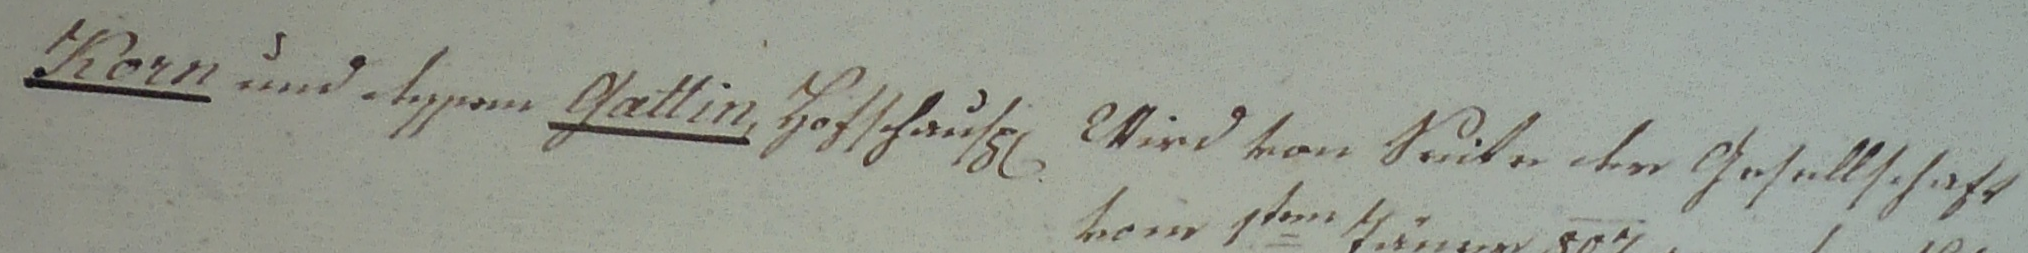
Korn und dessen Gattin, HofschauspE Wird von Seite der Gesellschaft
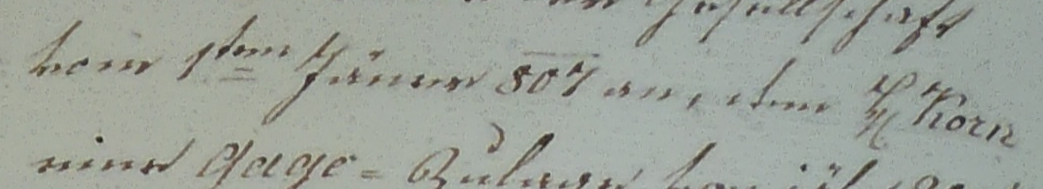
vom 1te͇m Jäner 8͞0͞7 an den HE Korn
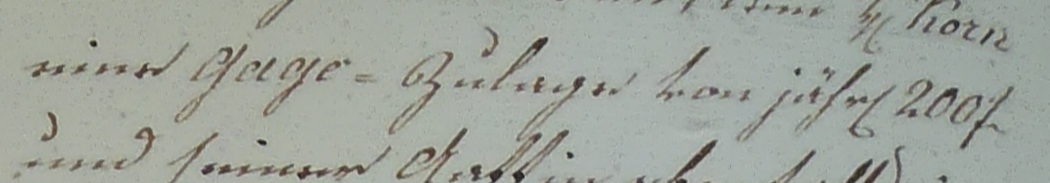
eine Gage=Zulage von jährE 200 fn
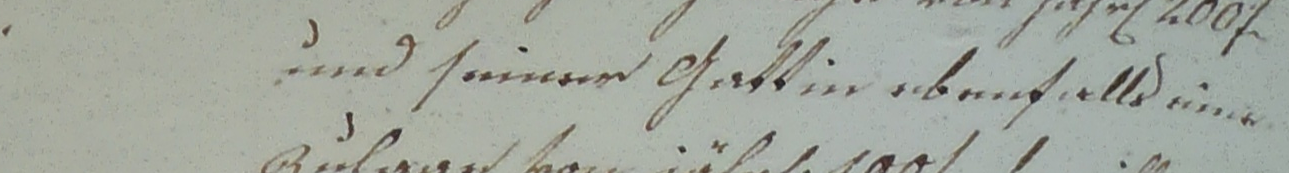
und seiner Gattin ebenfalls eine
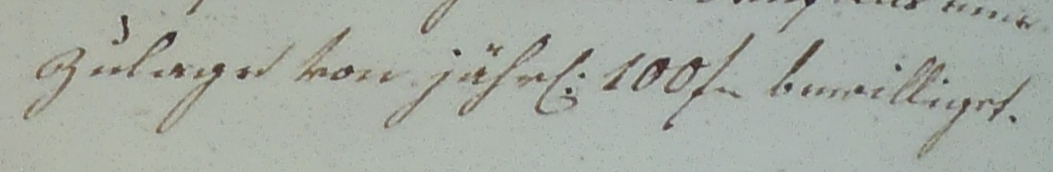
Zulage von jährE: 100 fn bewilliget.
